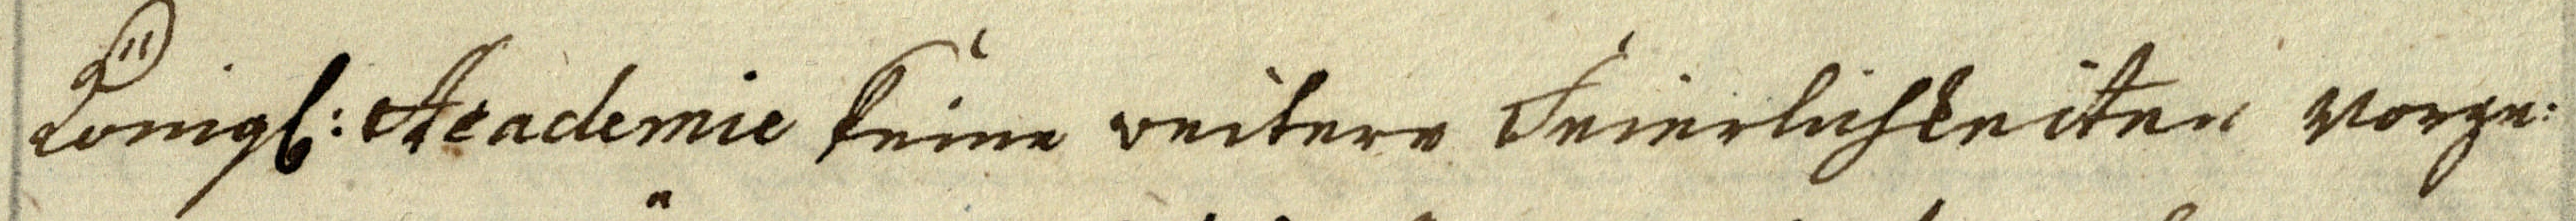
Königl. Academie keine weitern Feierlichkeiten vorge¬
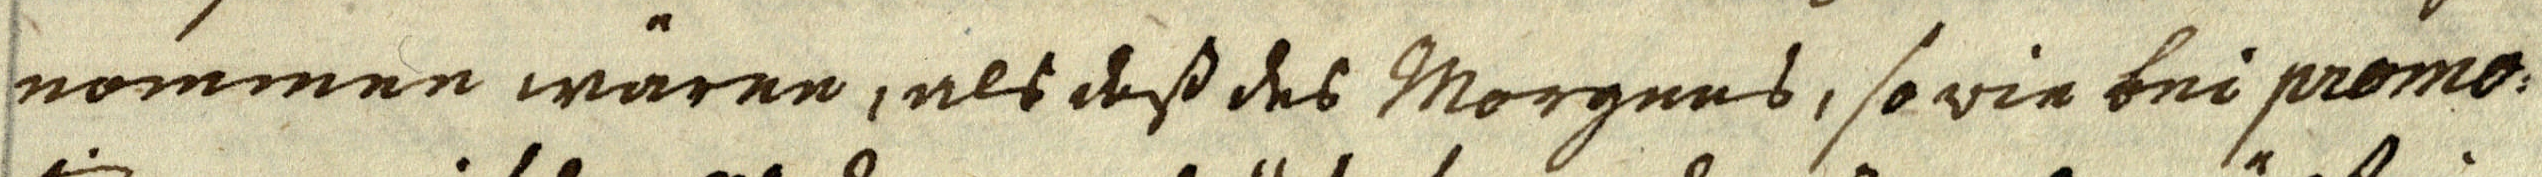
nommen wären, als daß des Morgens, so wie bei promo¬
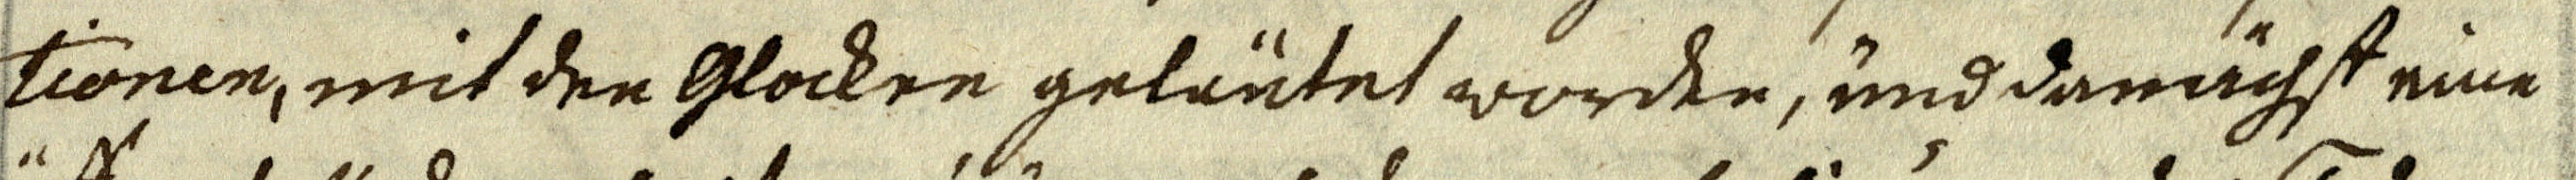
tionen, mit den Glocken geläutet worden, und danächst eine,
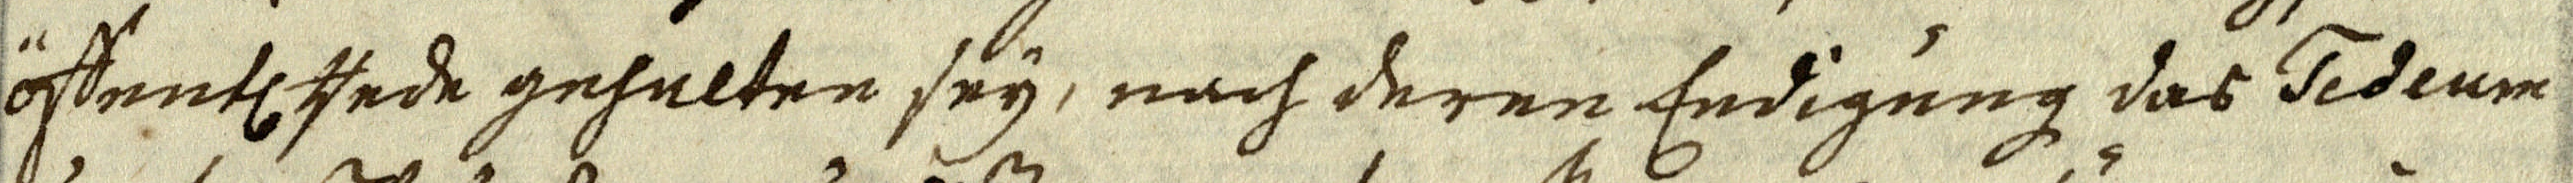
öffentl. Rede gehalten seÿ, nach deren Endigung das Tedeum
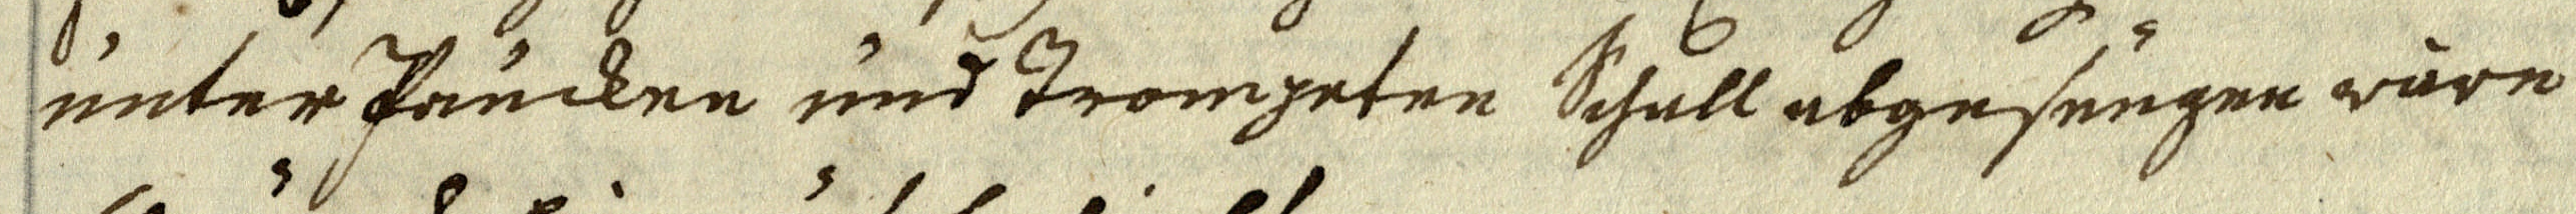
unter Paucken und Trompeten Schall abgesungen wäre.
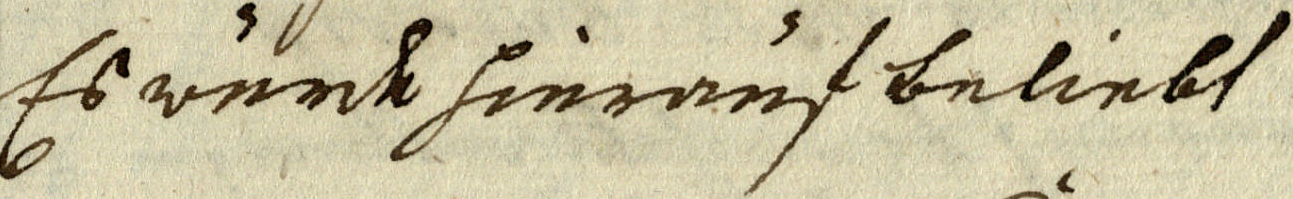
Es wurde hierauf beliebt
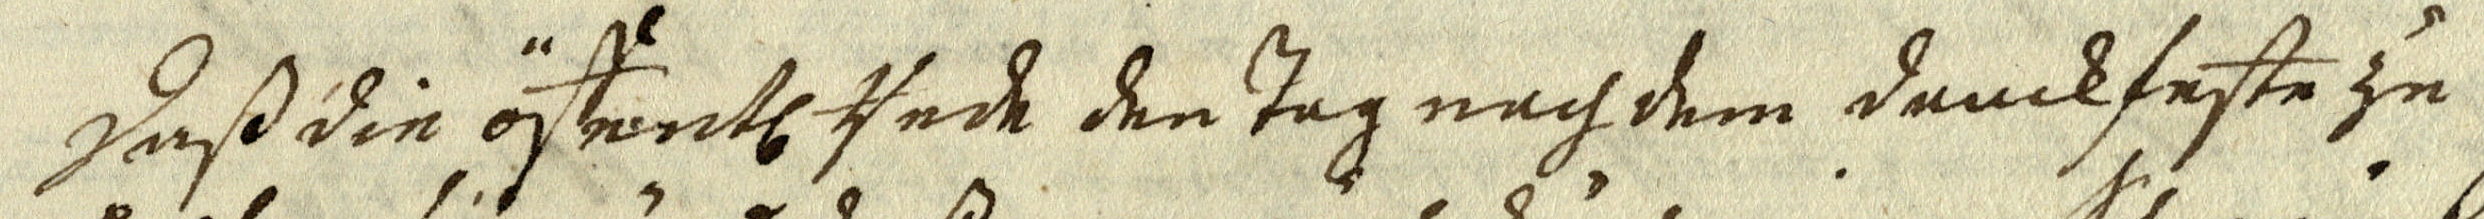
Daß die öffentl. Rede den Tag nach dem Danckfeste zu
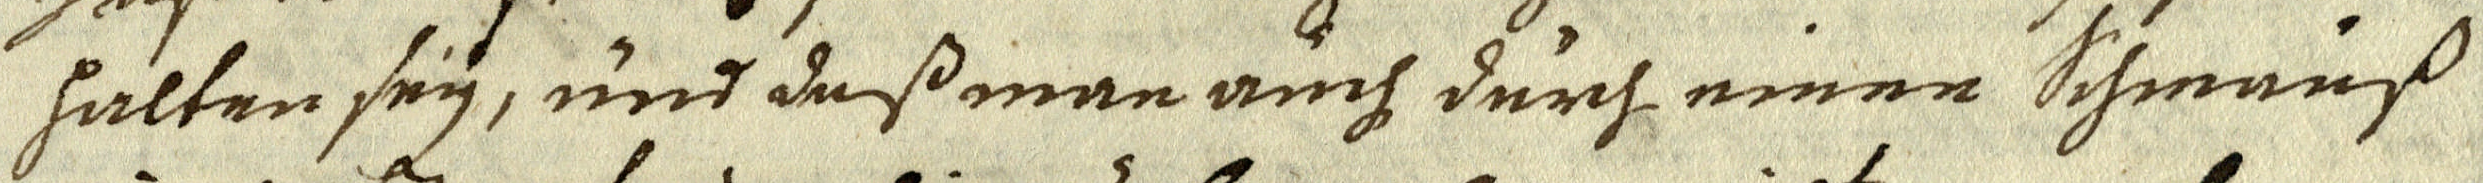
halten seÿ, und daß man auch durch einen Schmauß
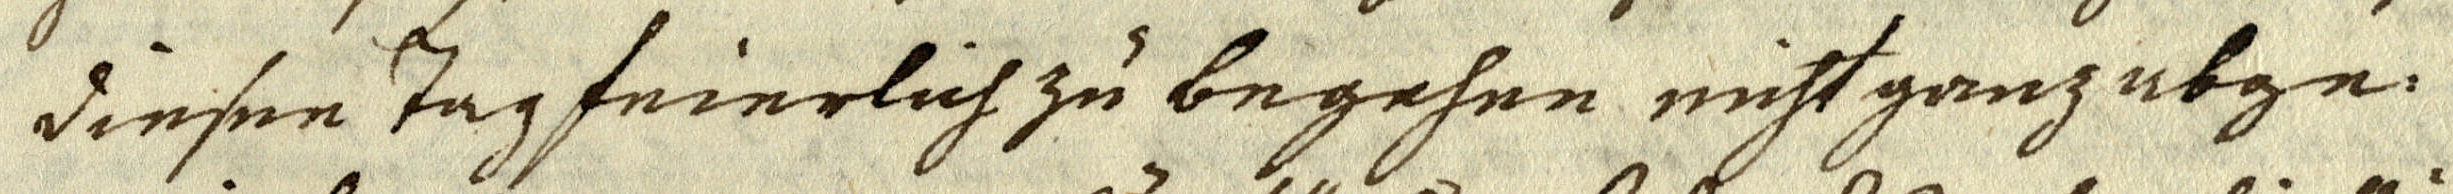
diesen Tag feierlich zu begehen nicht ganz abge¬
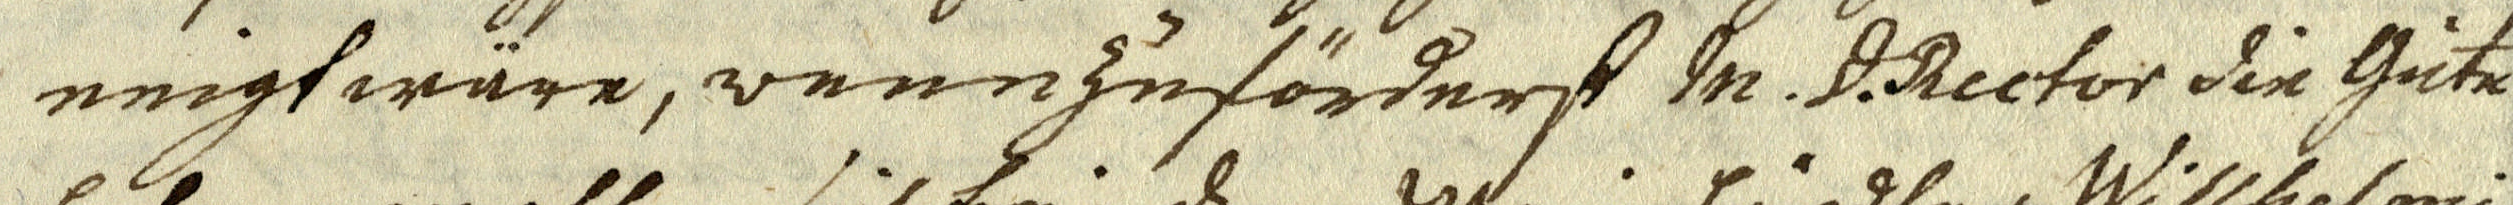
neigt wäre, wenn zuförderst M. D. Rector die Güte
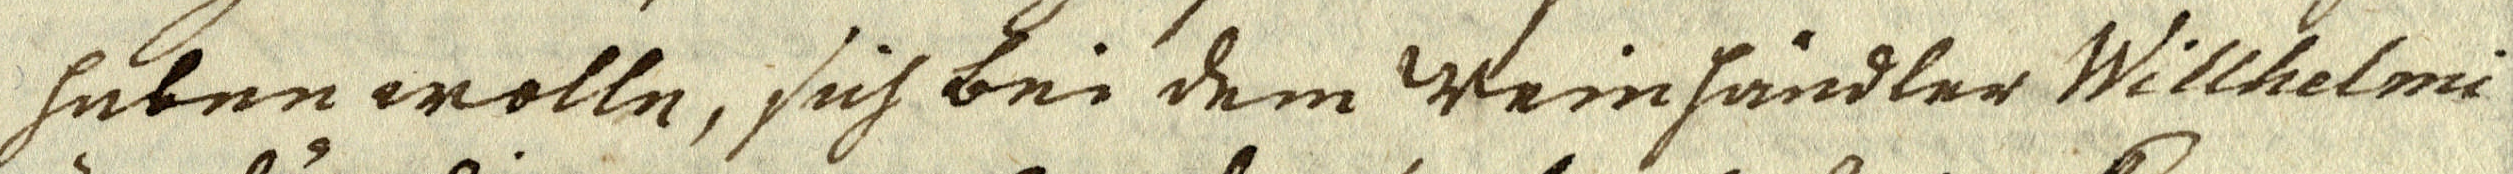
haben wolle, sich bei dem Weinhändler Willhelmi
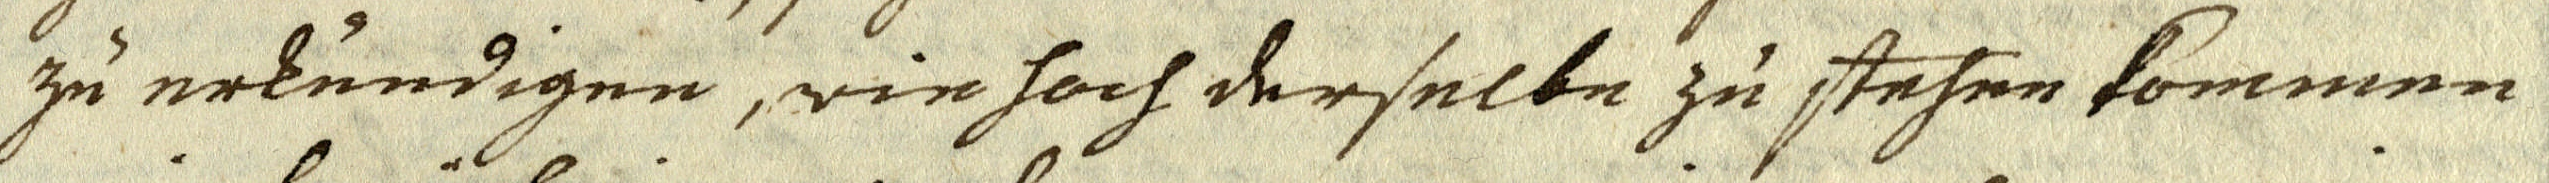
zu erkundigen, wie hoch derselbe zu stehen kommen
